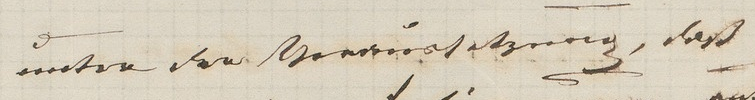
unter der Voraussetzung, daß
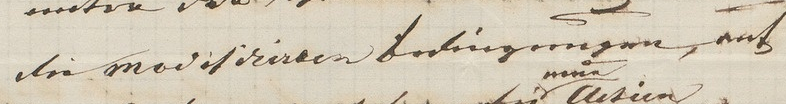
die modificirten Bedingungen, auf
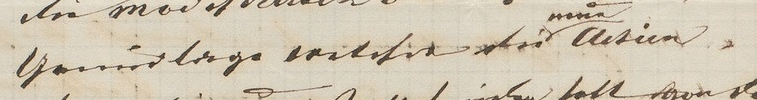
Grundlage welcher die neuen Actien
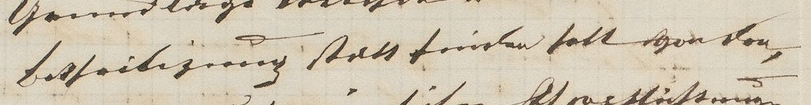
Betheiligung statt finden soll von den,
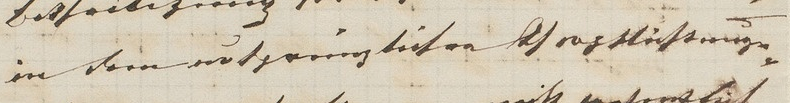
in dem ursprünglichen Verpflichtungs-
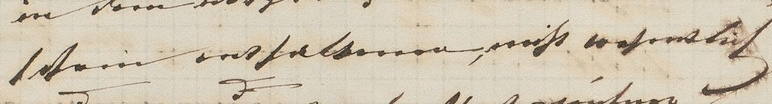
schein enthaltenen, nicht wesentlich
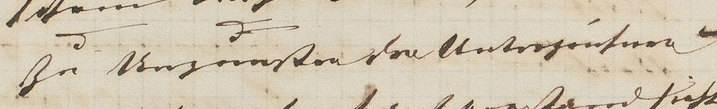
zu Ungunsten der Unterzeichner
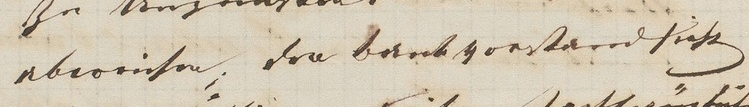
abweichen; der Bankvorstand sieht
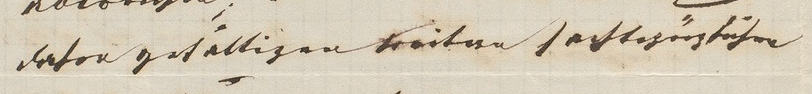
daher gefälligen weitern sachbezüglchen
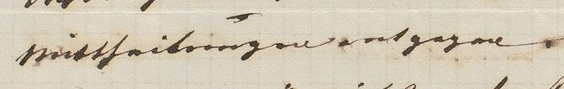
Mittheilungen entgegen.
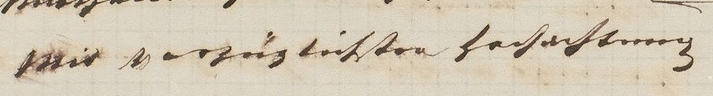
Mit vorzüglichster Hochachtung
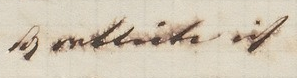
verbleibe ich
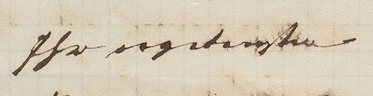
Ihr ergebenster
